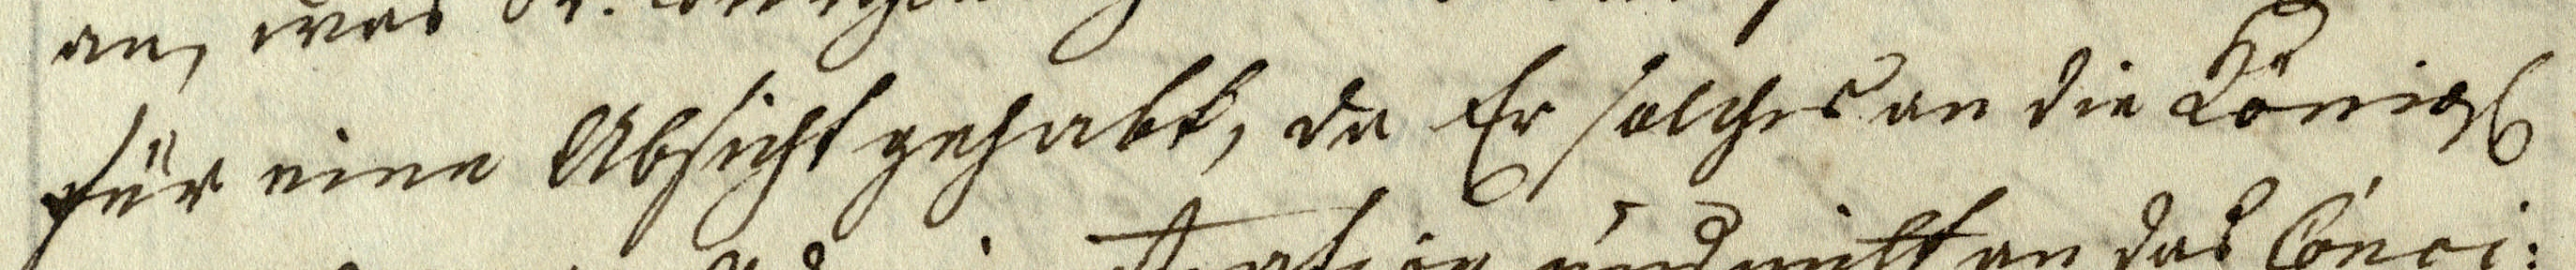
für eine Absicht gehabt, da Er solches an die Königl.
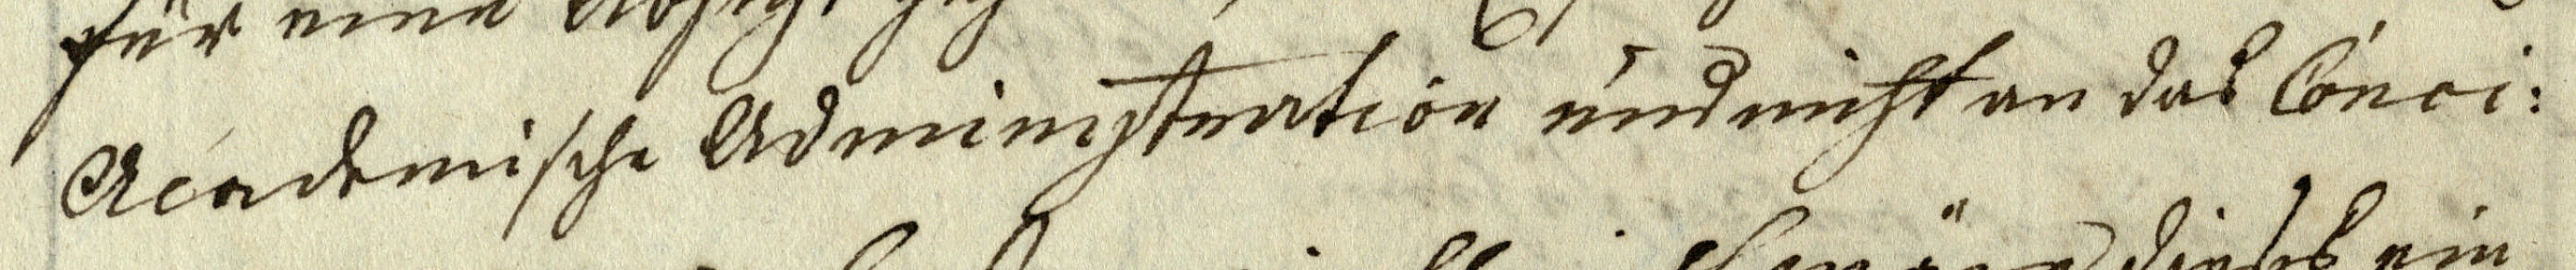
Academische Administration und nicht an das Conci¬
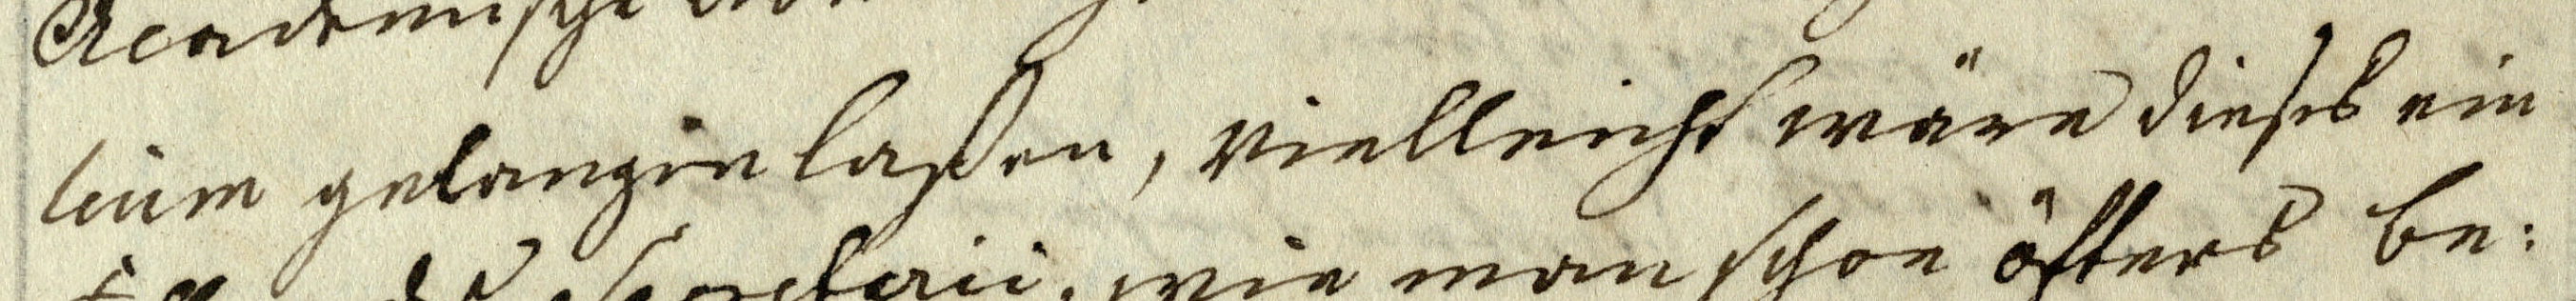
lium gelangen laßen, vielleicht wäre dieses ein
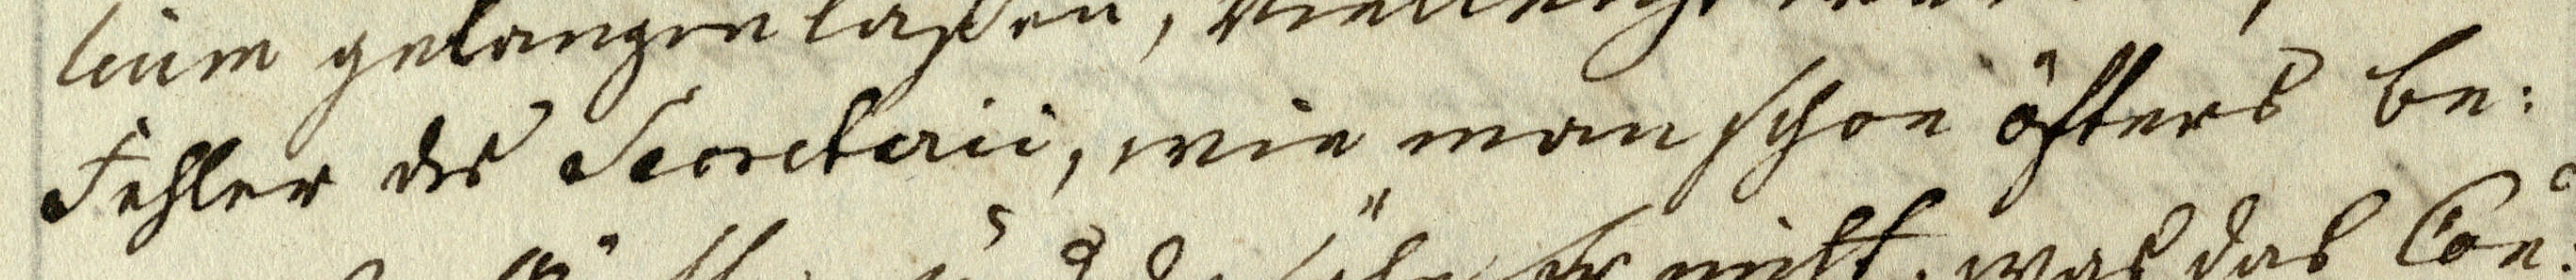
Fehler des Secretarii, wie man schon öfters be¬
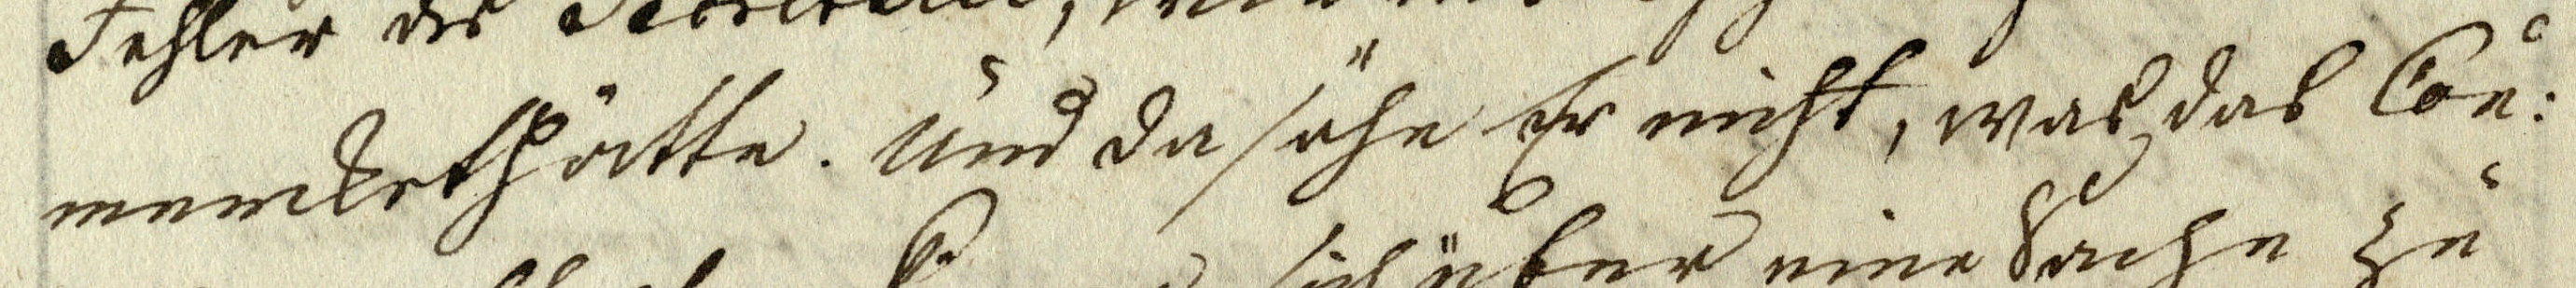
mercket hätte. Und da sähe Er nicht, was das Con¬
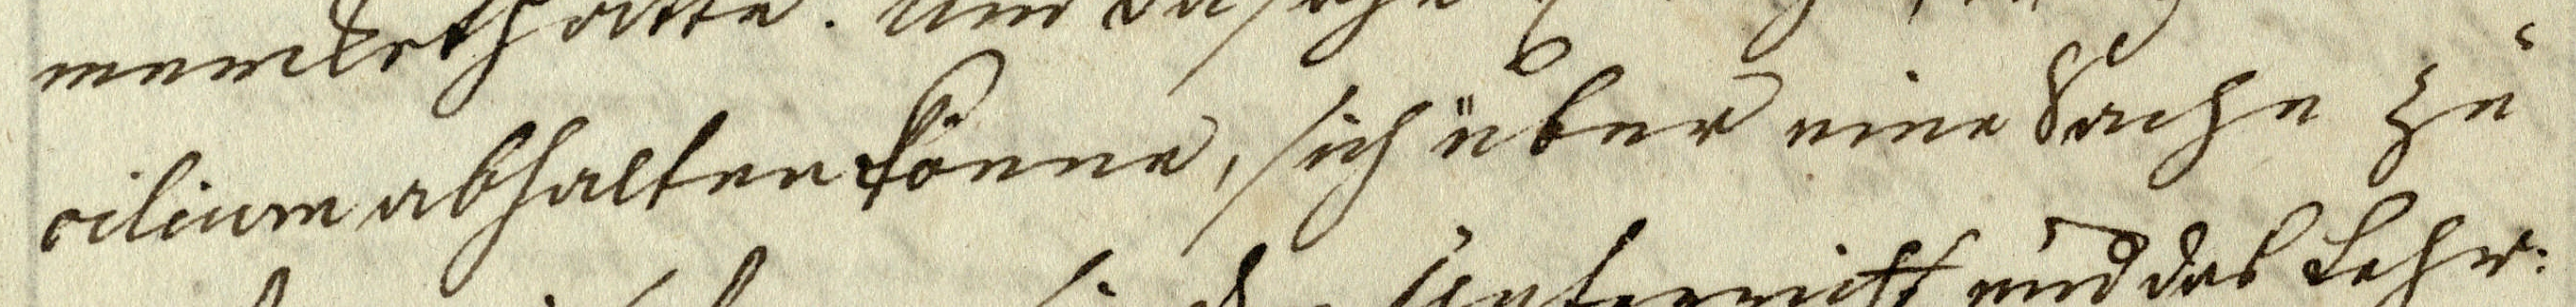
cilium abhalten könne, sich über eine Sache zu
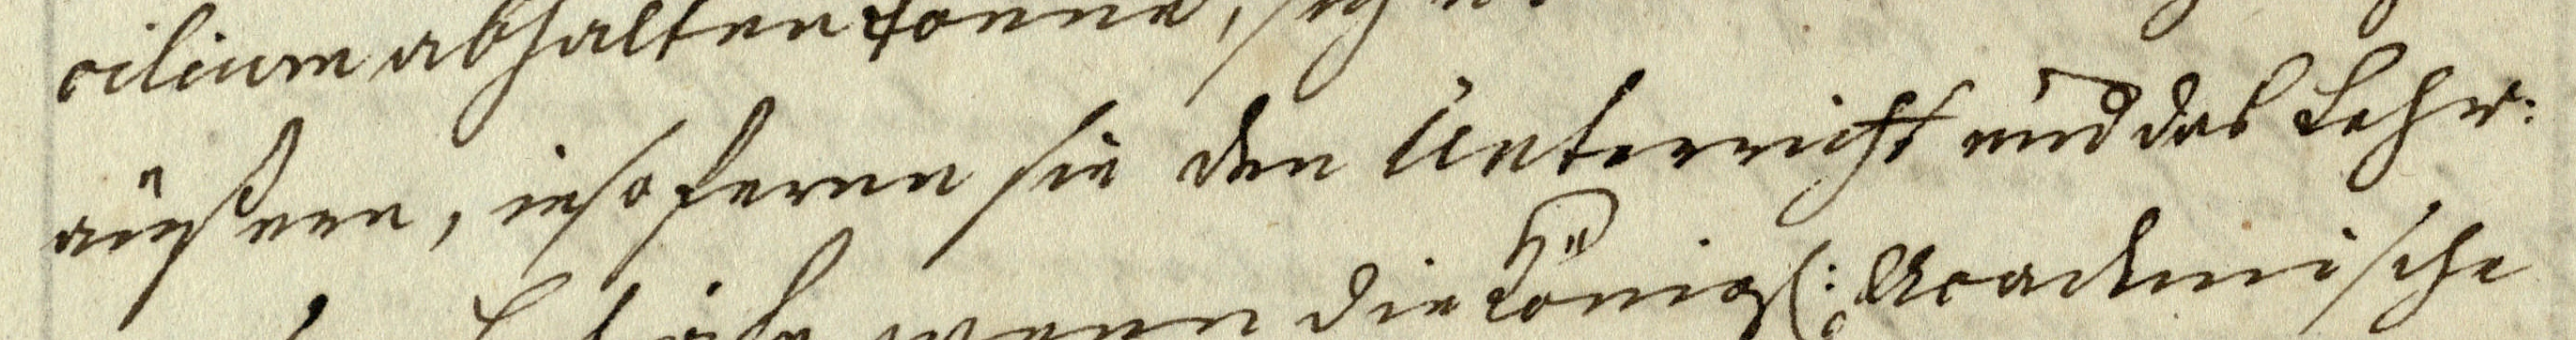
äußern, insoferne sie den Unterricht und das Lehr¬
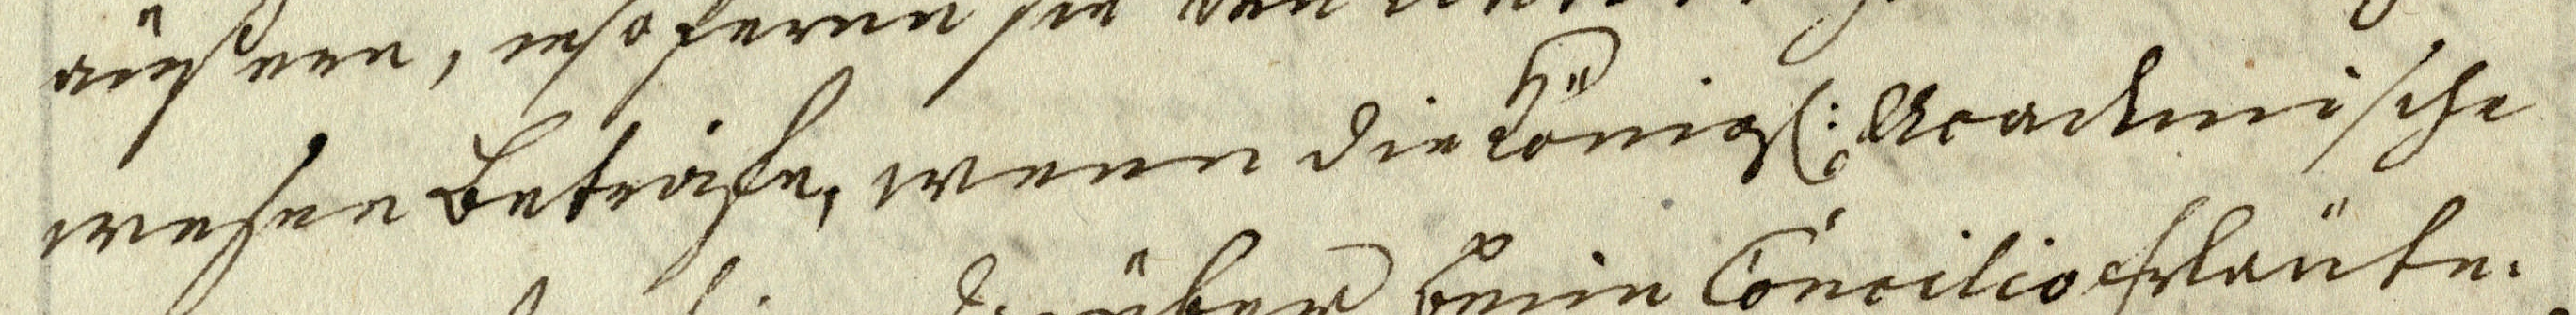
wesen beträfe, wenn die Königl. Academische
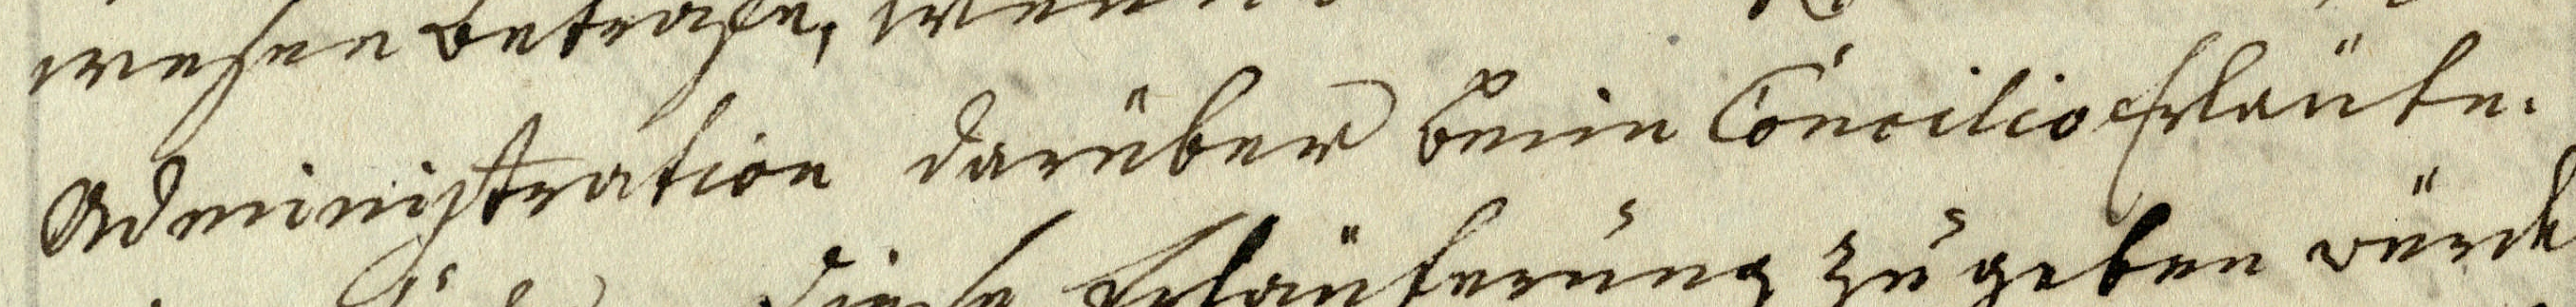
Administration darüber beim Concilio Erläute¬
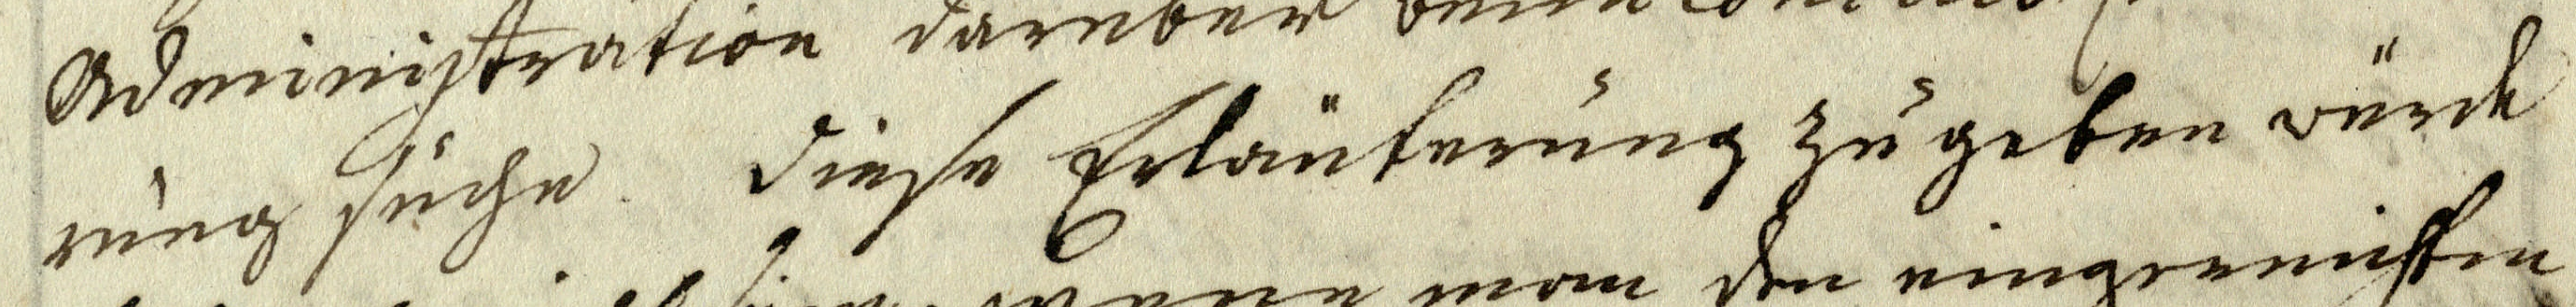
rung suche. Diese Erläuterung zu geben würde
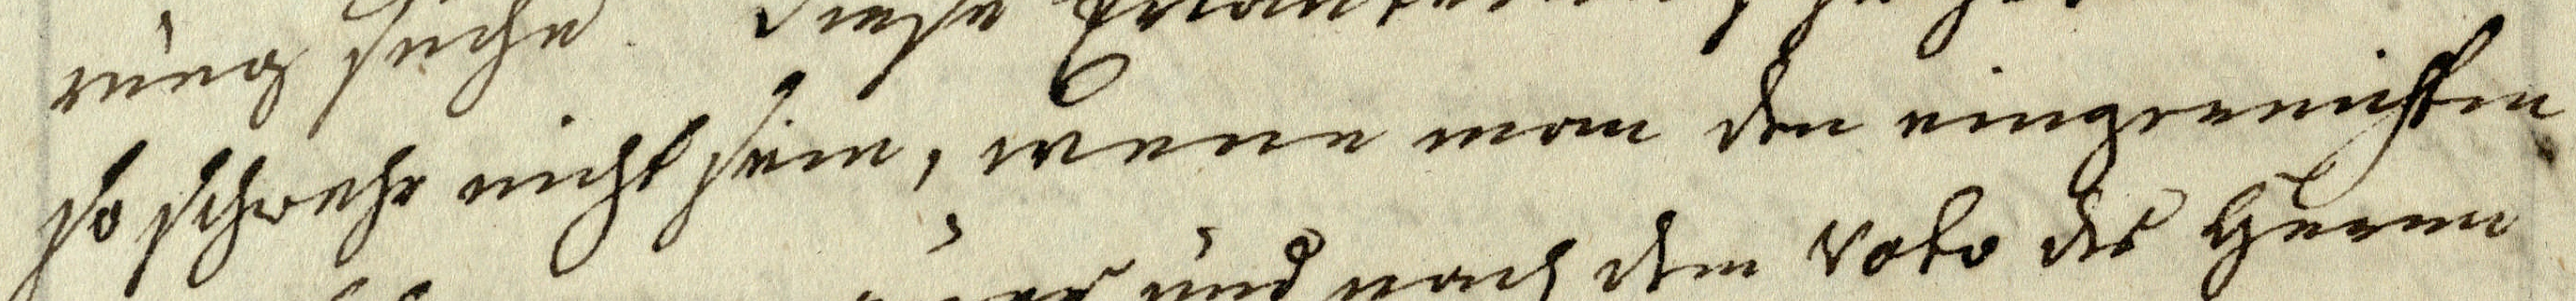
so schwehr nicht sein, wenn man den eingereichten
